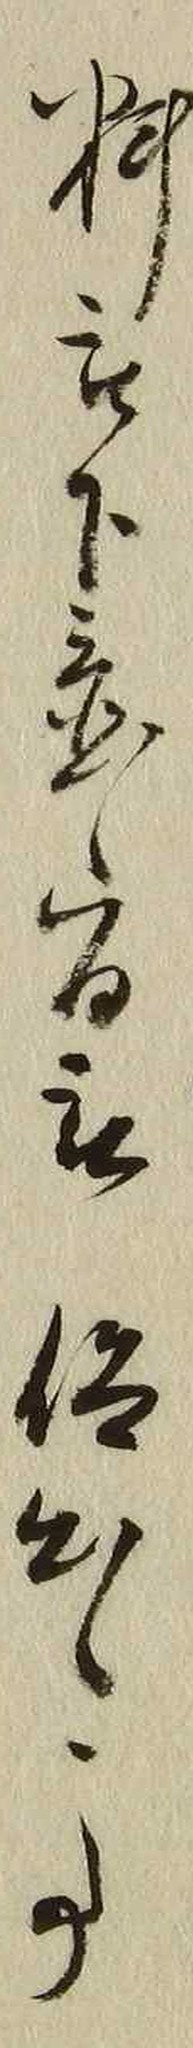料被下置候旨被仰出候事
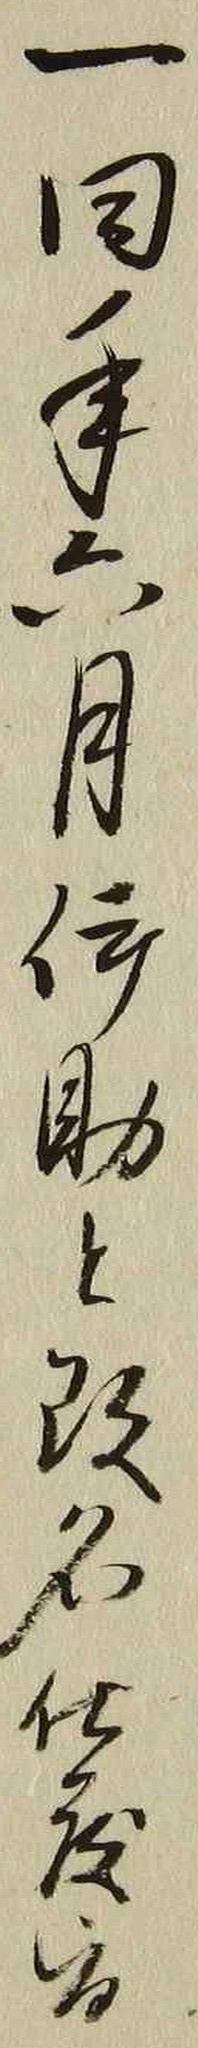一同年六月伊助と改名仕度旨
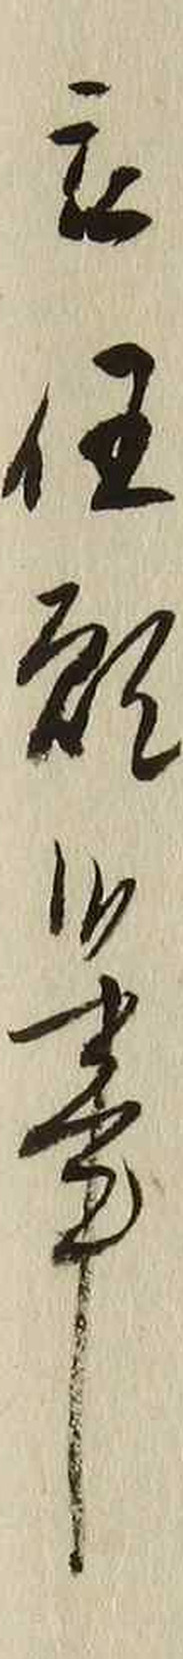被任願候事
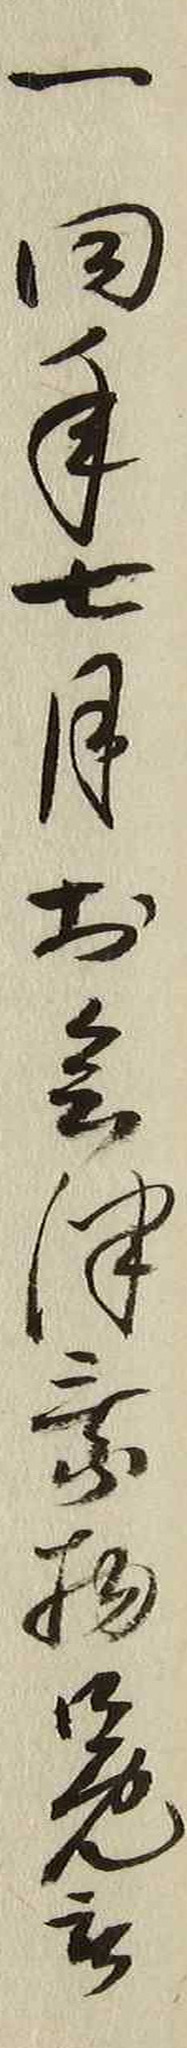一同年七月於会津乗物御免被
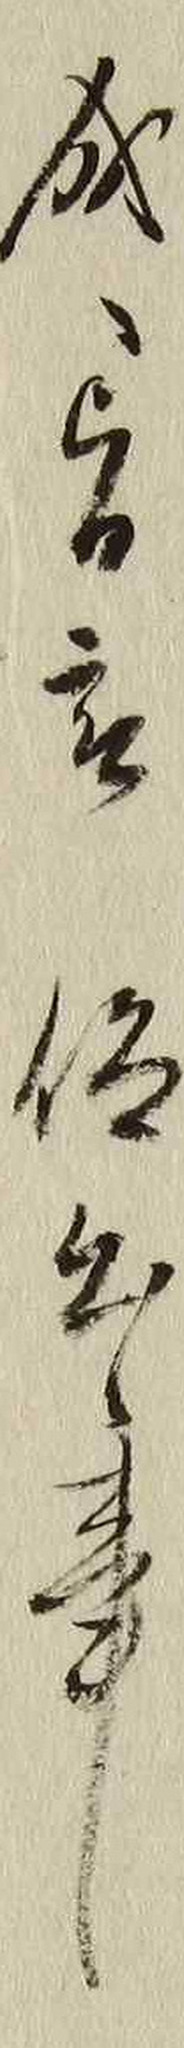成候旨被仰出候事
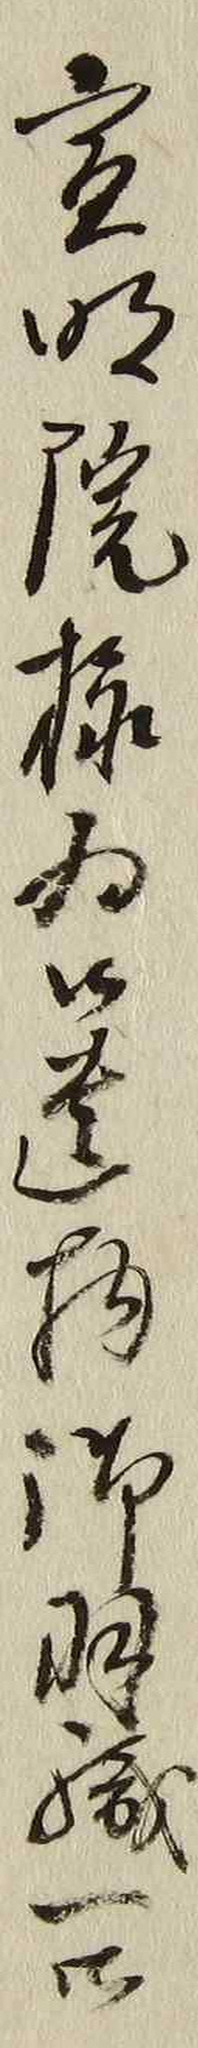宣明院様為御遺物御羽織一御
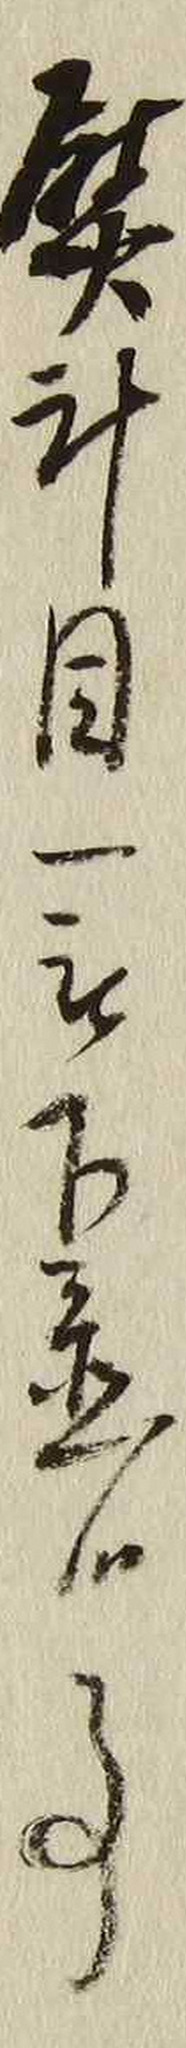熨斗目一被下置候事
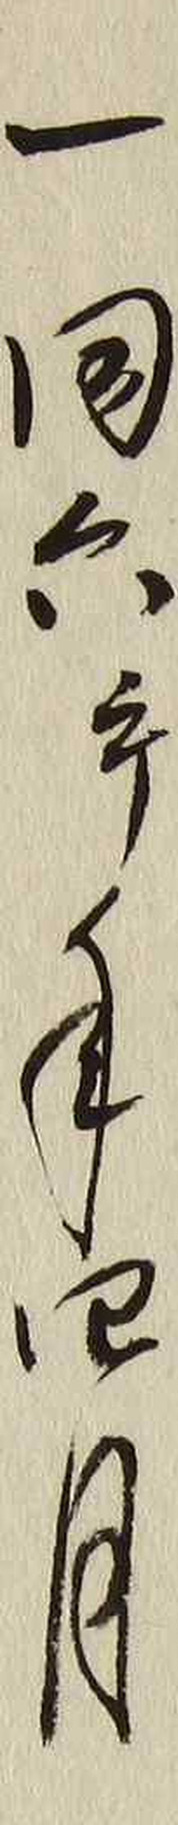一同六午年四月
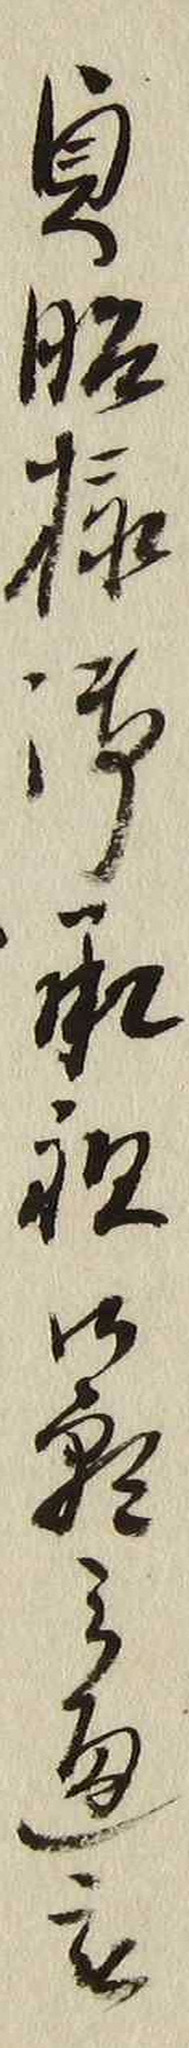貞昭様御承祖御願之通被
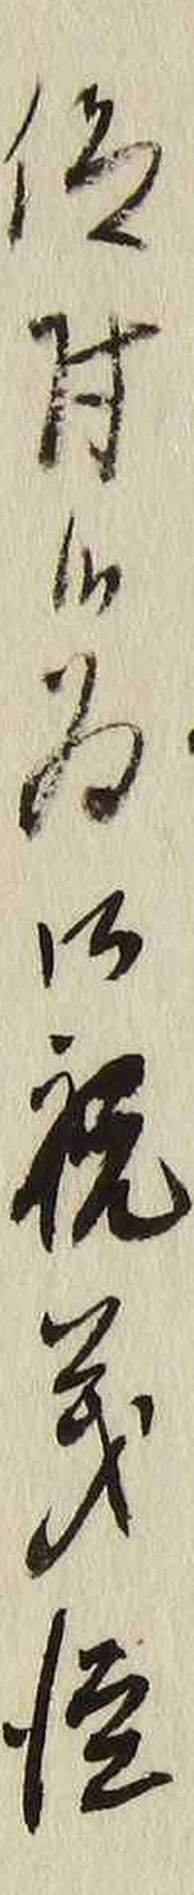仰付候為御祝義従
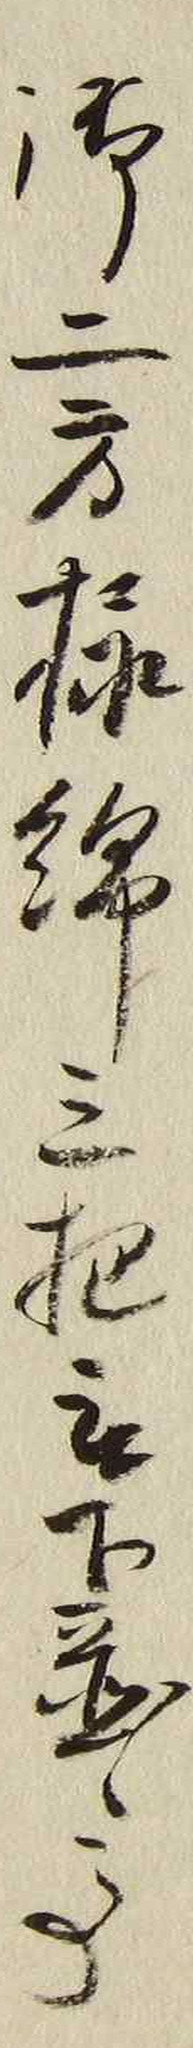御二方様綿三把被下置候事
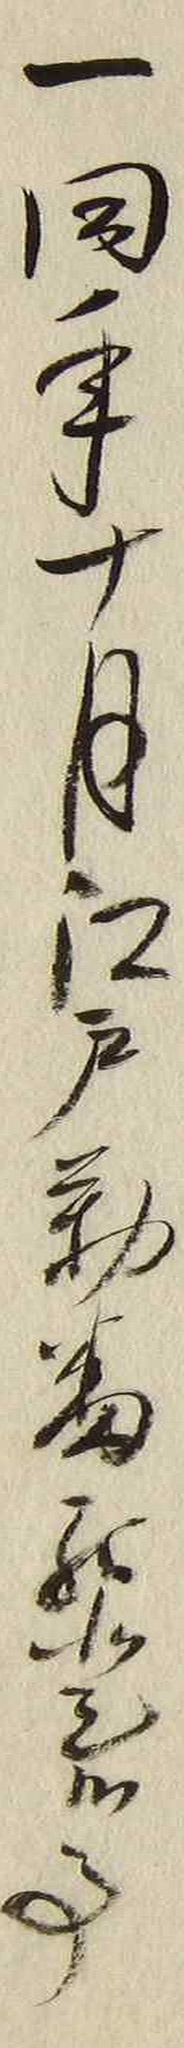一同年十月江戸勤番罷登候事

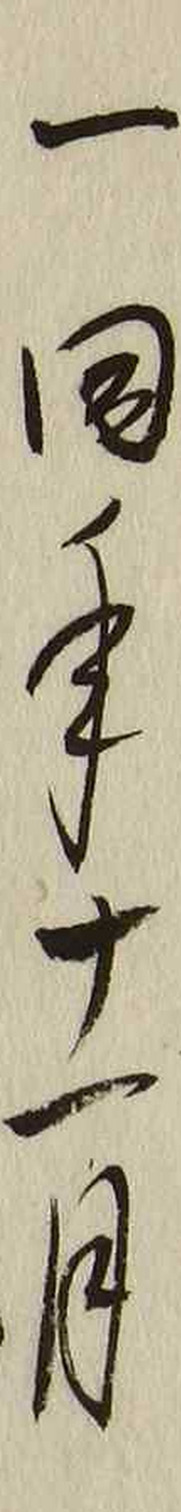一同年十一月
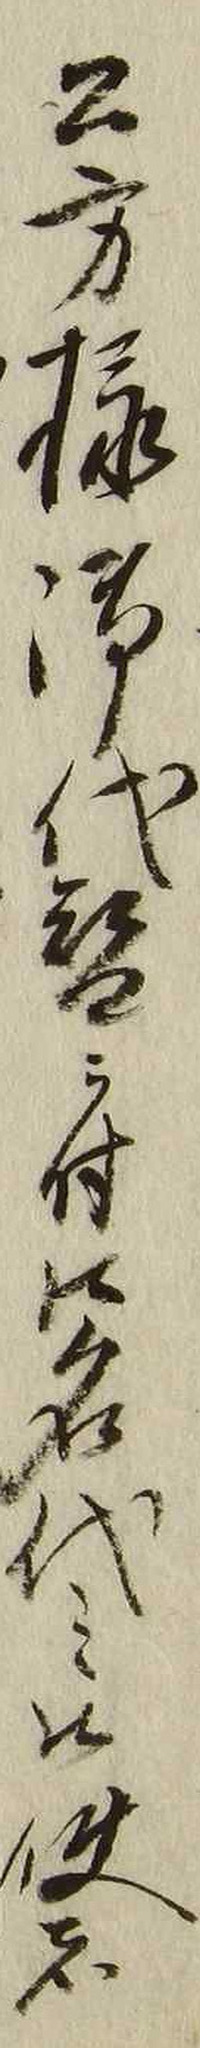公方様御代替ニ付御名代之御使者
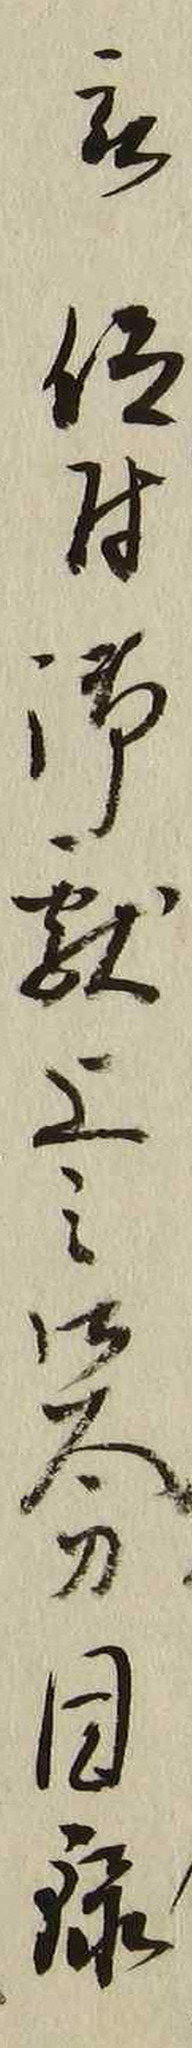被仰付御献上之御太刀目録
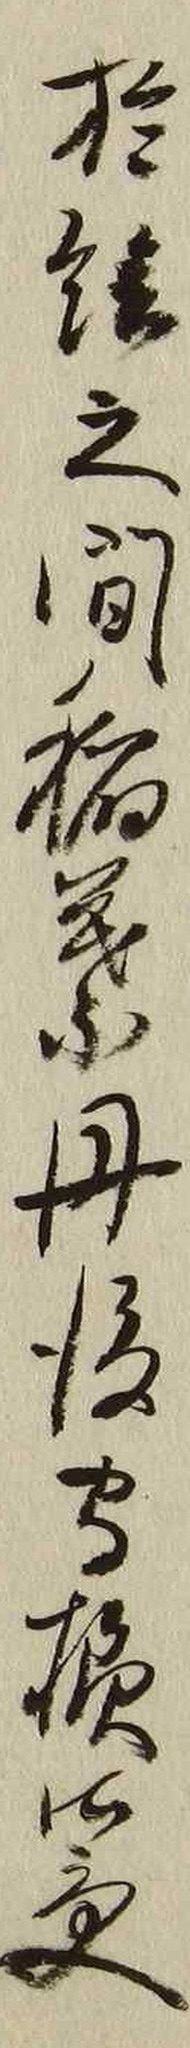於絵之間稲葉丹後守様御受
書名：諸士系譜　巻之351　す之部1
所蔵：会津若松市立会津図書館
